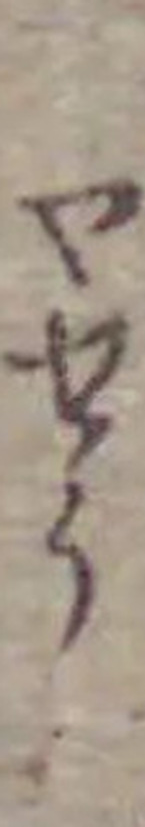やせう
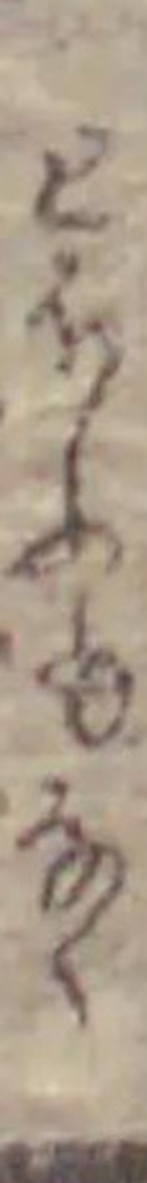とほふもなく
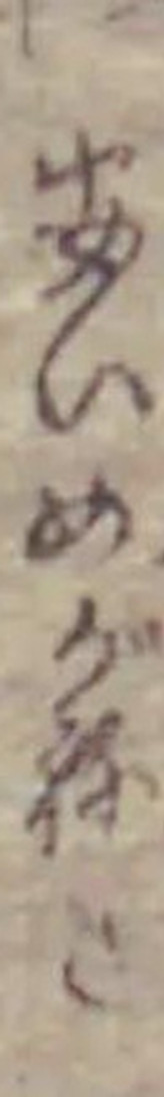安いめがねた
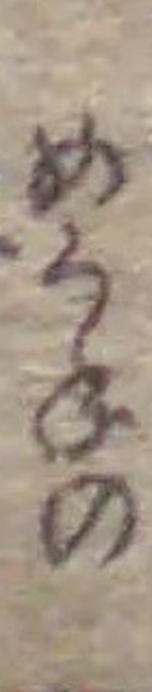めかねの
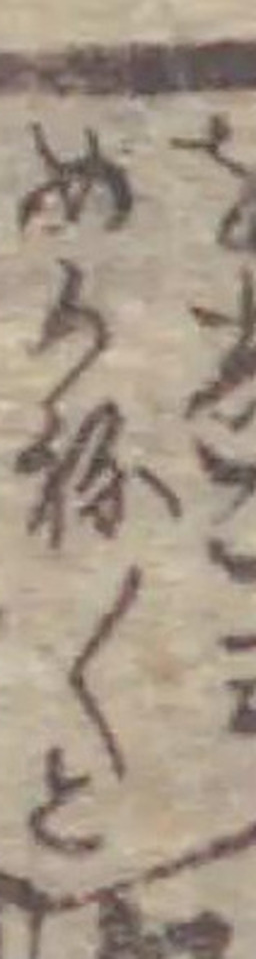めかね〳〵と
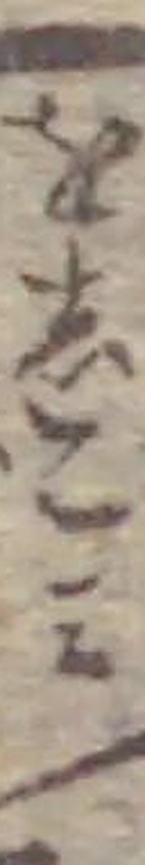をしこみ
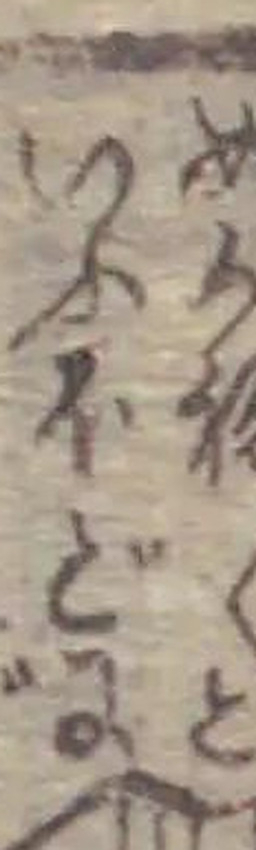いふほどに

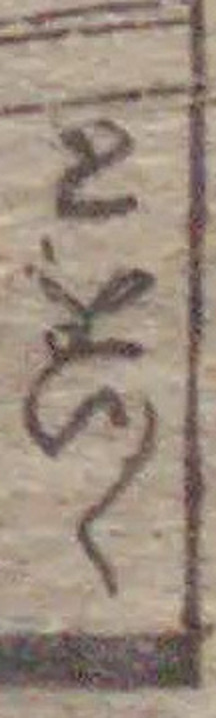とをい〳〵
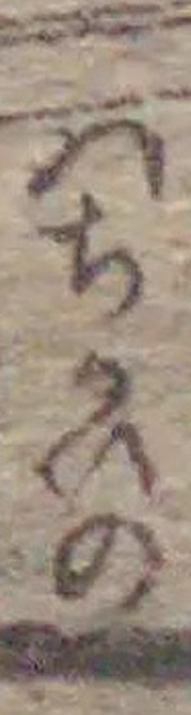はちかいの
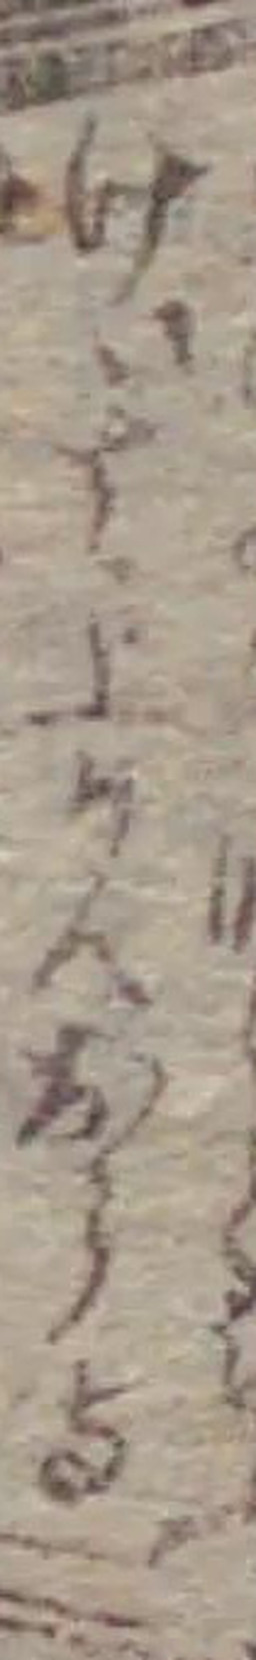け其上かんおう寺
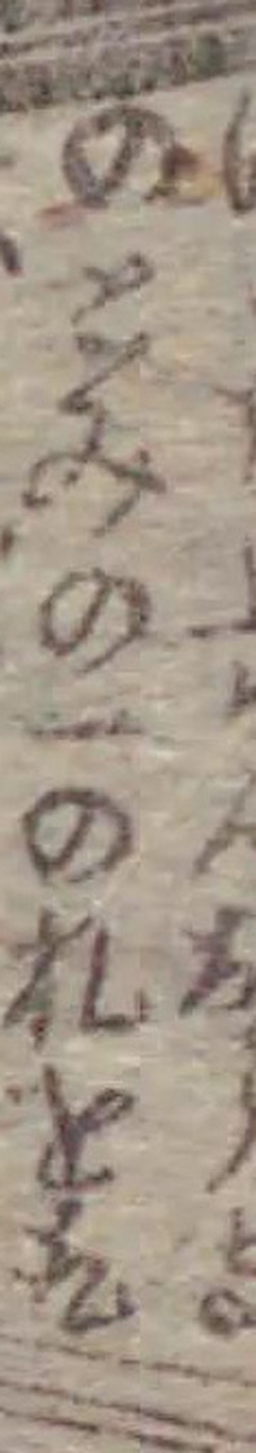のとみの一の札を取
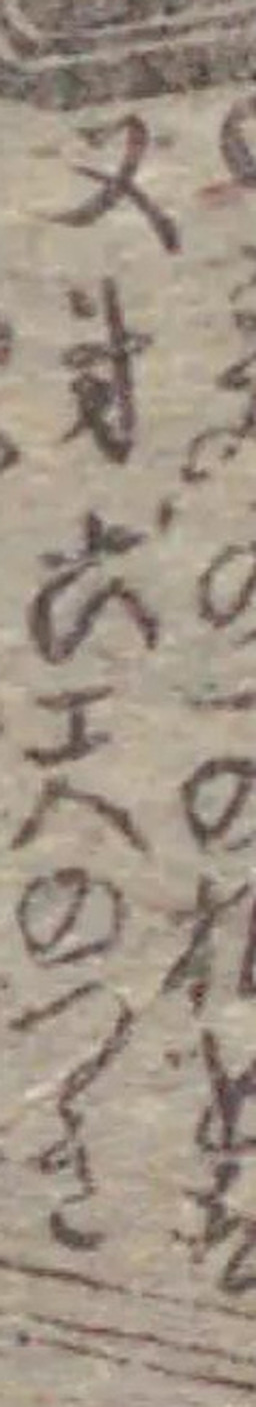又第六天のつき
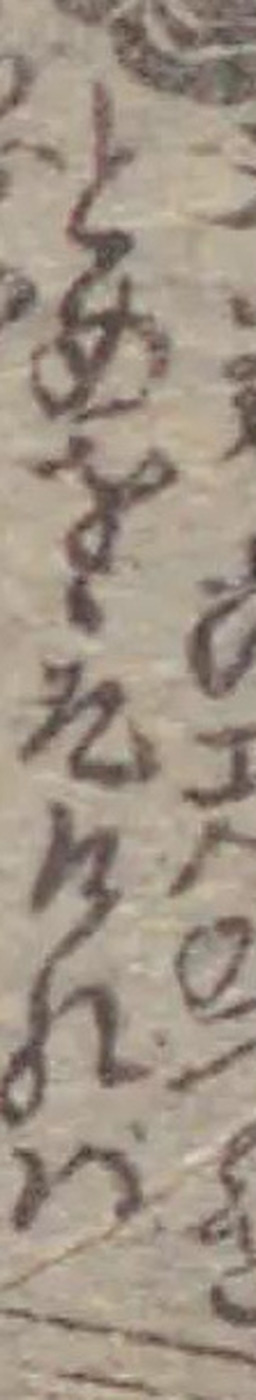とめを取けれは
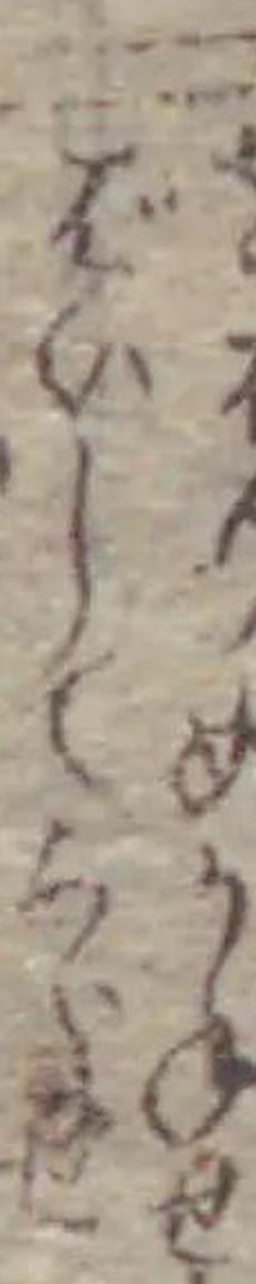ばいしてくらせ
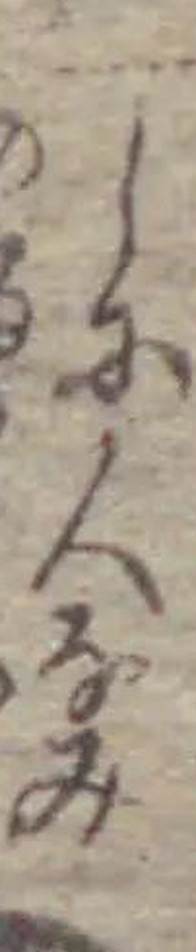しに人なみ
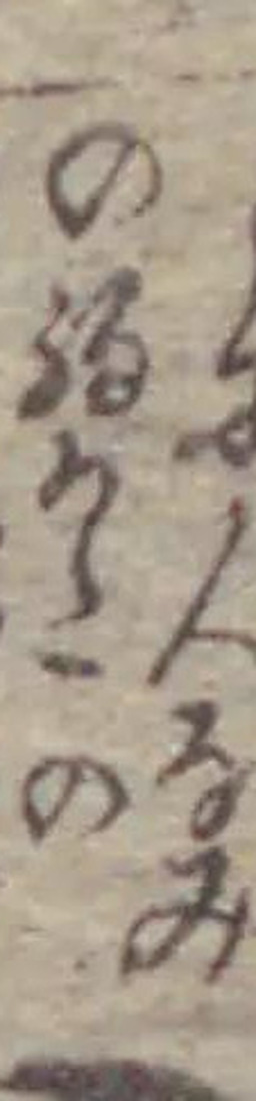の駒かたの
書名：栄増眼鏡徳 3巻
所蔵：国立国会図書館 National Diet Library, JAPAN
